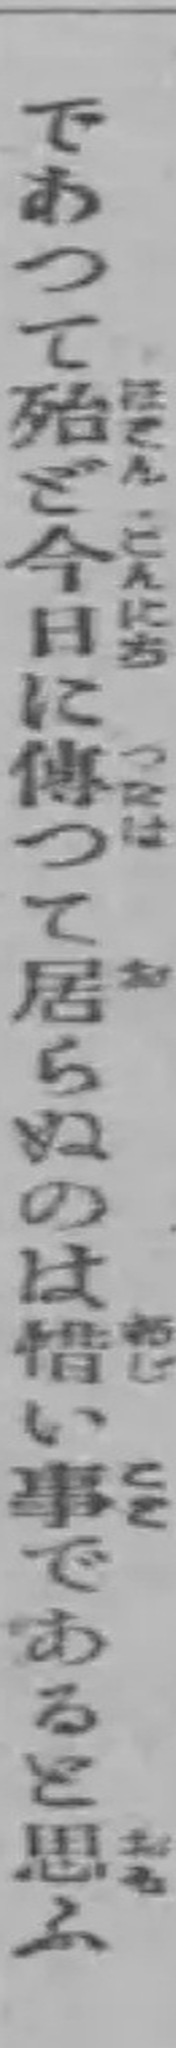であつて殆ど今日に伝つて居らぬのは惜い事であると思ふ
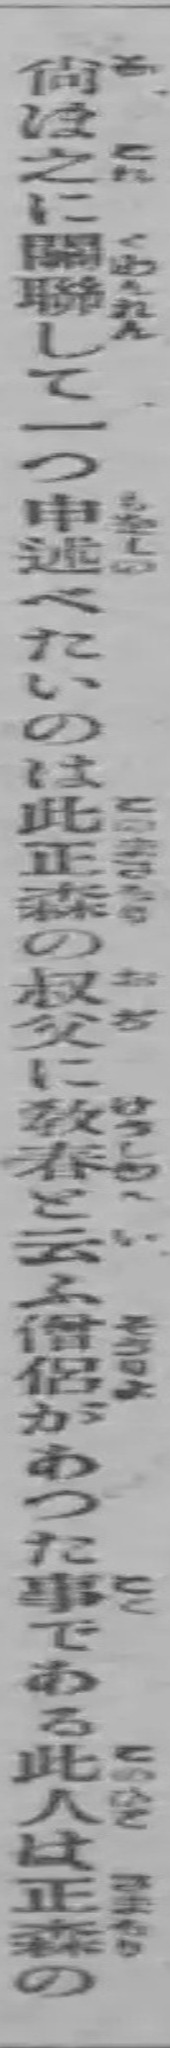僧教春尚ほ之に関連して一つ申述べたいのは此正森の叔父に教春と云ふ僧侶があつた事である此人は正森の
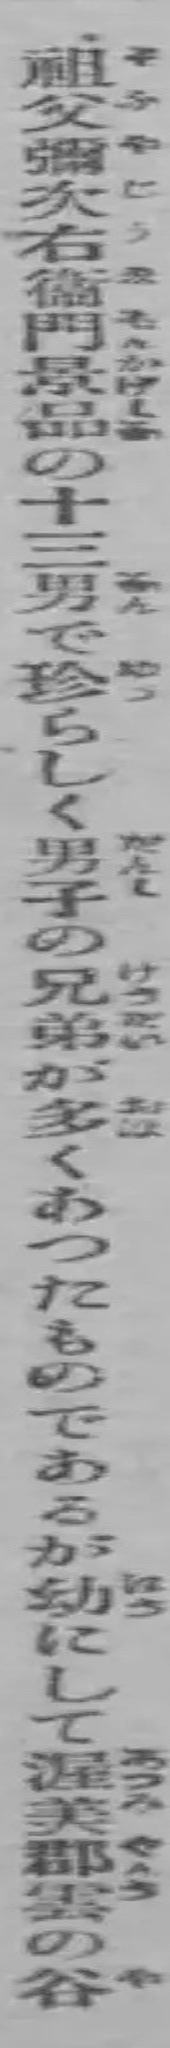祖父弥次右衛門景品の十三男で珍らしく男子の兄弟が多くあつたものであるが幼にして渥美郡雲の谷
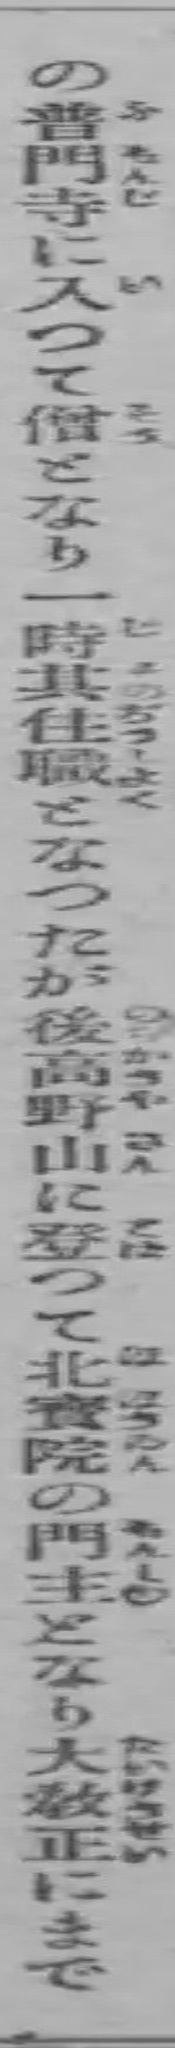の普門寺に入つて僧となり一時其住職となつたが後高野山に登つて北宝院の門主となり大教正にまで
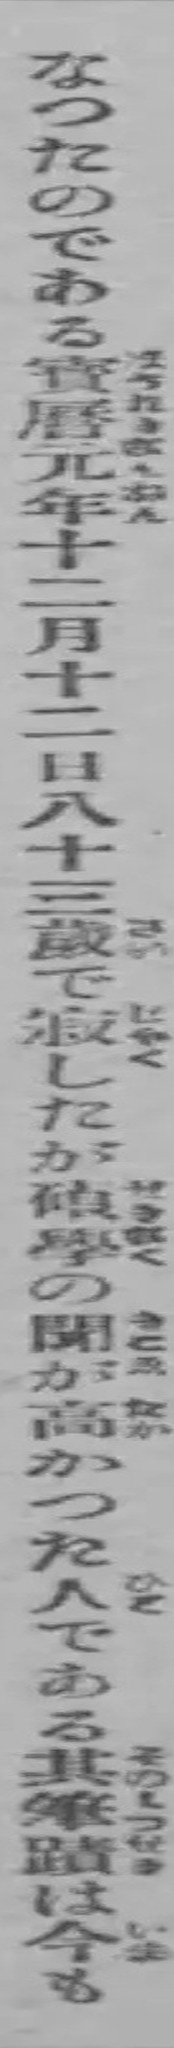なつたのである宝暦元年十二月十二日八十三歳で寂したが碩学の聞が高かつた人である其筆蹟は今も
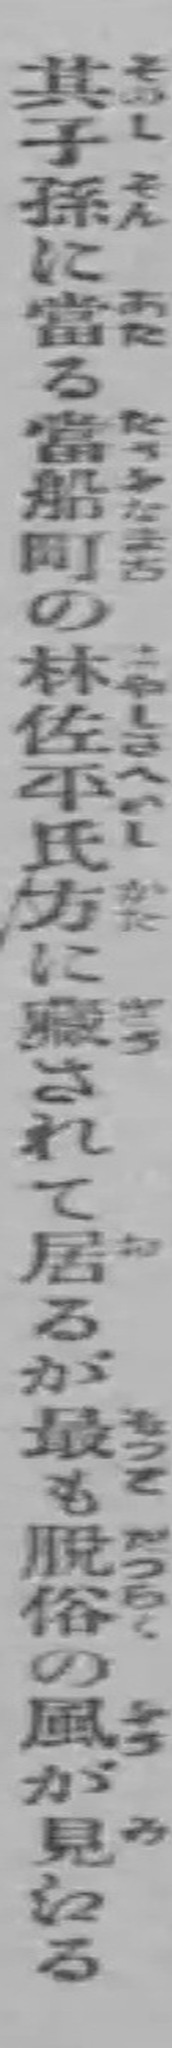其子孫に当る当船町の林佐平氏方に蔵されて居るが最も脱俗の風が見える
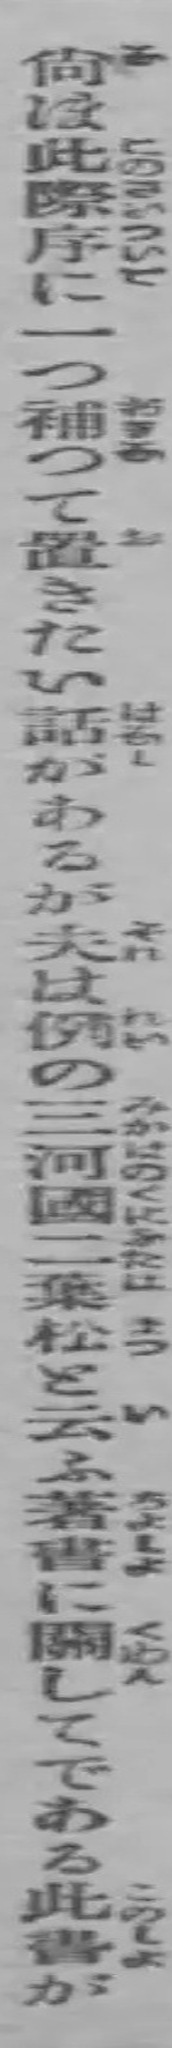尚ほ此際序に一つ補つて置きたい話があるが夫は例の三河国二葉松と云ふ著書に関してである此書が
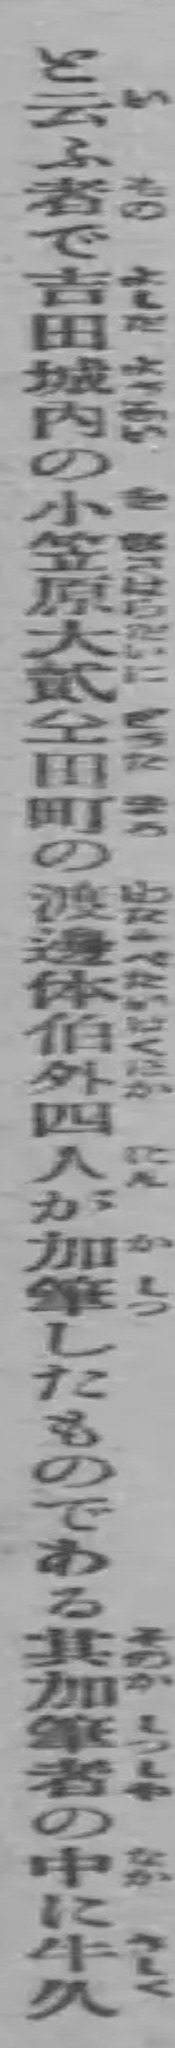と云ふ者で吉田城内の小笠原大弐仝田町の渡邊体伯外四人が加筆したものである其加筆者の中に牛久

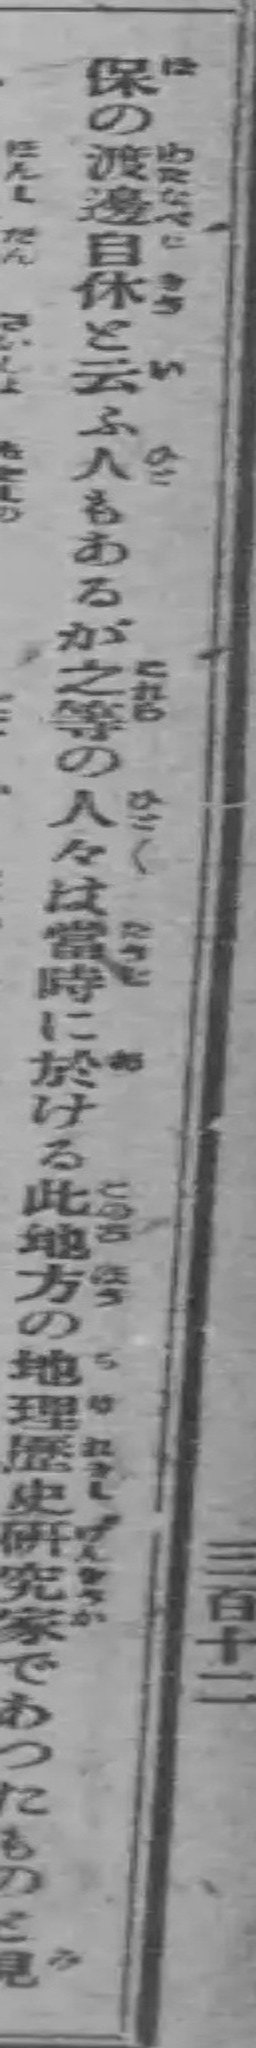保の渡邊自休と云ふ人もあるが之等の人々は当時に於ける此地方の地理歴史研究家であつたものと見
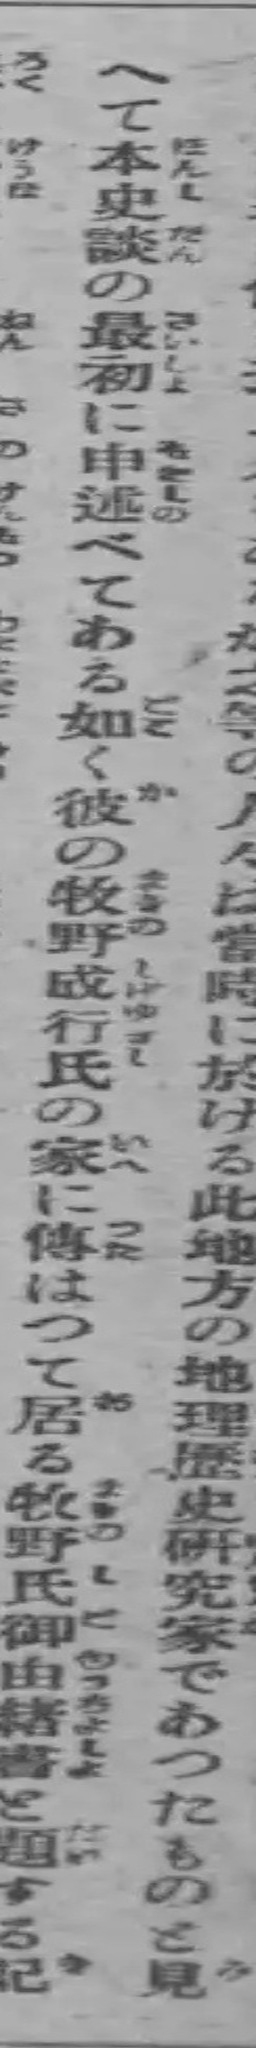へて本史談の最初に申述べてある如く彼の牧野成行氏の家に伝はつて居る牧野氏御由緒書と題する記
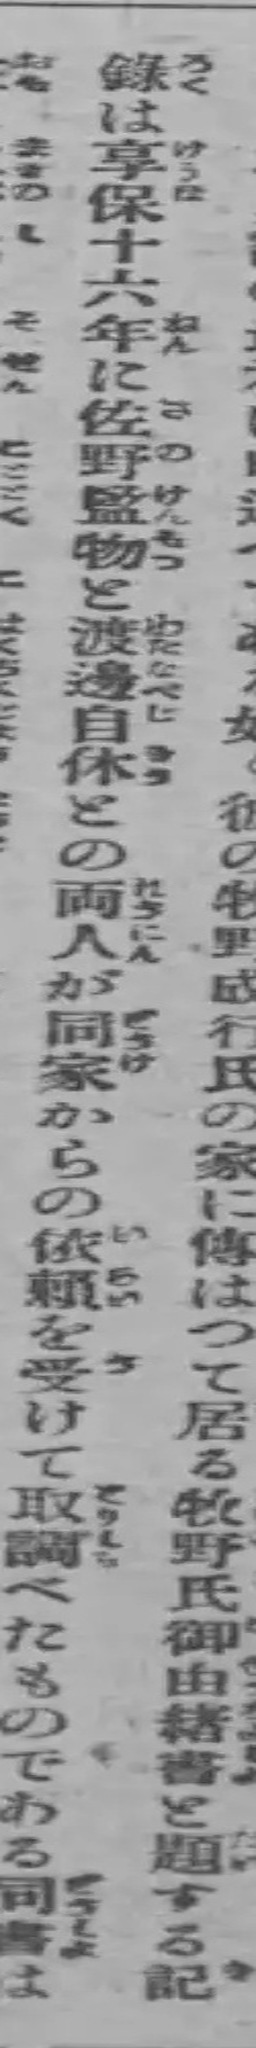録は享保十六年に佐野監物と渡邊自休との両人が同家からの依頼を受けて取調べたものである同書は
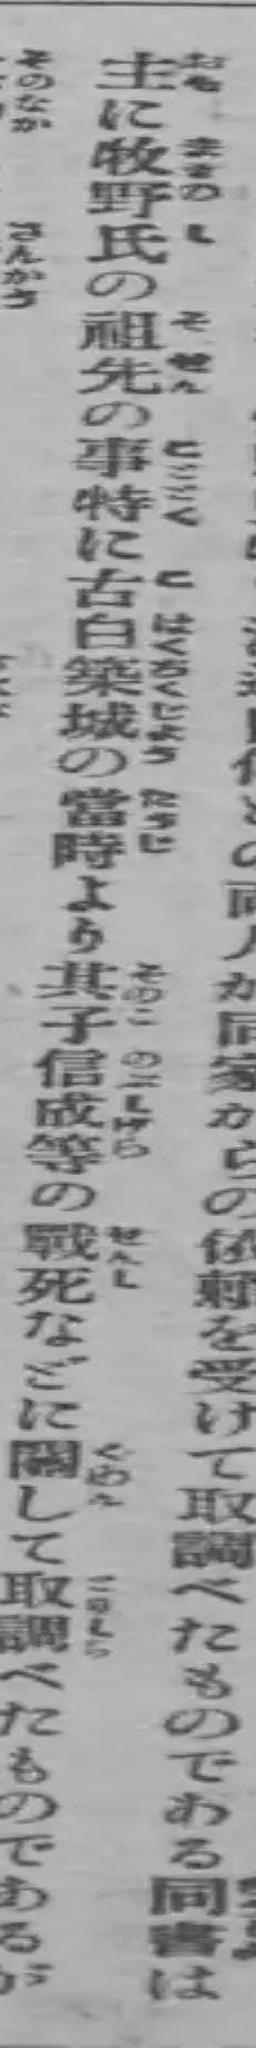主に牧野氏の祖先の事特に古白築城の当時より其子信成等の戦死などに関して取調べたものであるが
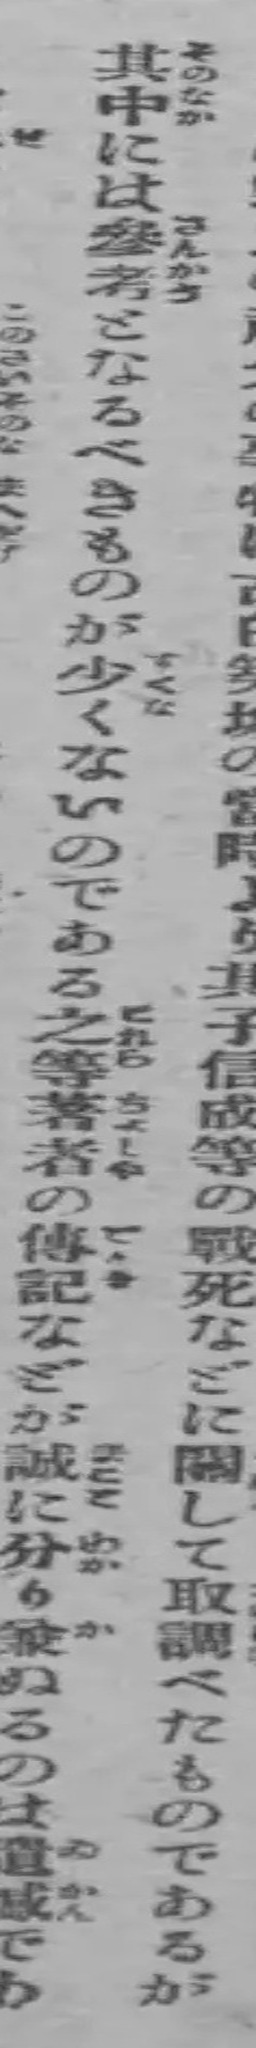其中には参考となるべきものが少くないのである之等著者の伝記などが誠に分り兼ぬるのは遺憾であ
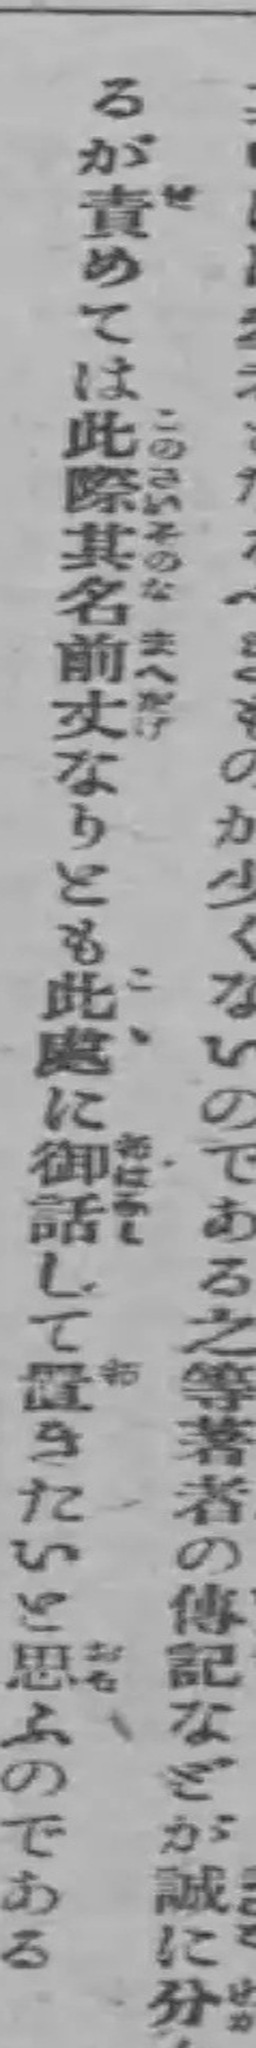るが責めては此際其名前丈なりとも此処に御話して置きたいと思ふのである
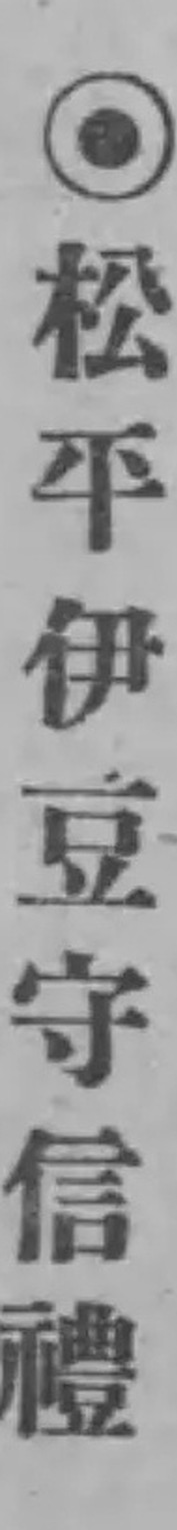⦿松平伊豆守信礼
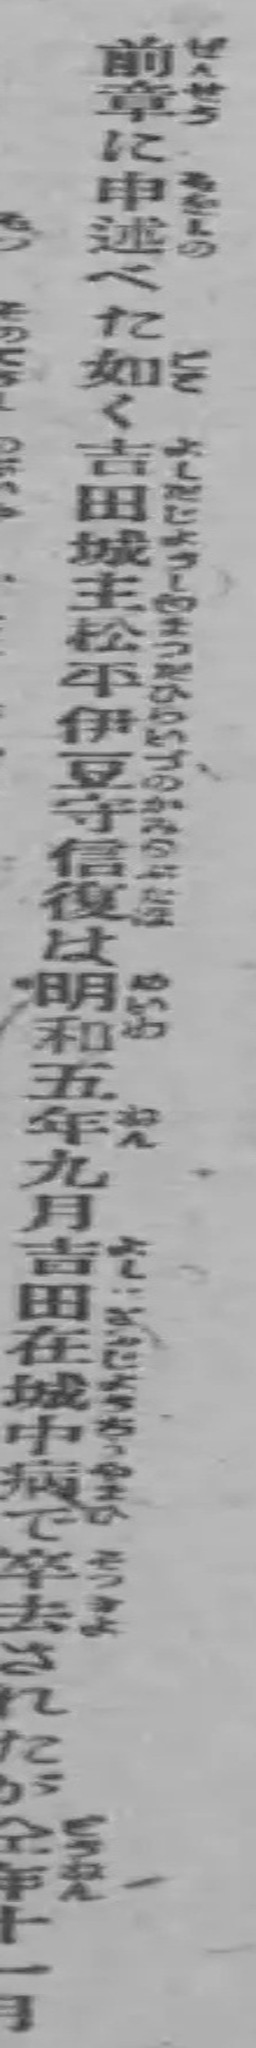松平信礼前章に申述べた如く吉田城主松平伊豆信復は明和五年九月吉田在城中病で卒去されたが仝年十一月
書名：豊橋市史談
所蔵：国立国会図書館 National Diet Library, JAPAN
